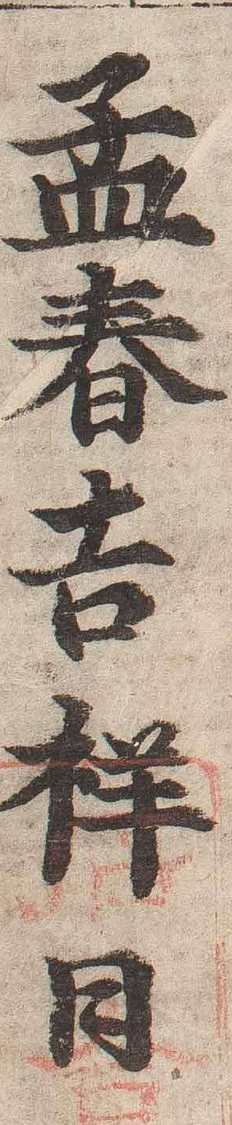孟春吉祥日
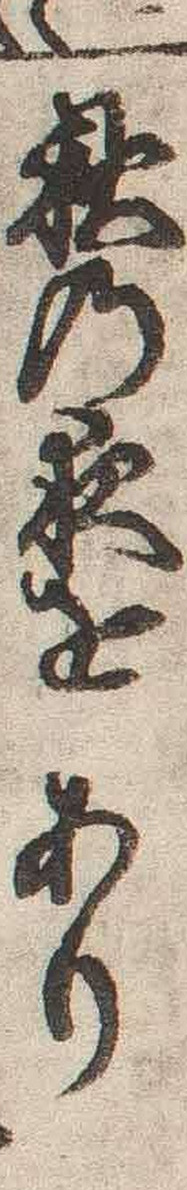秋の夜をあり
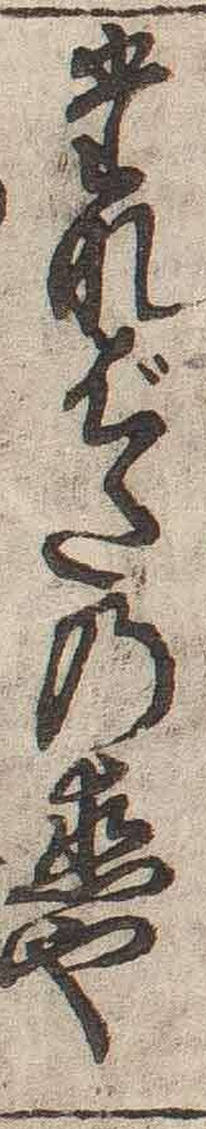たなばたの恋や
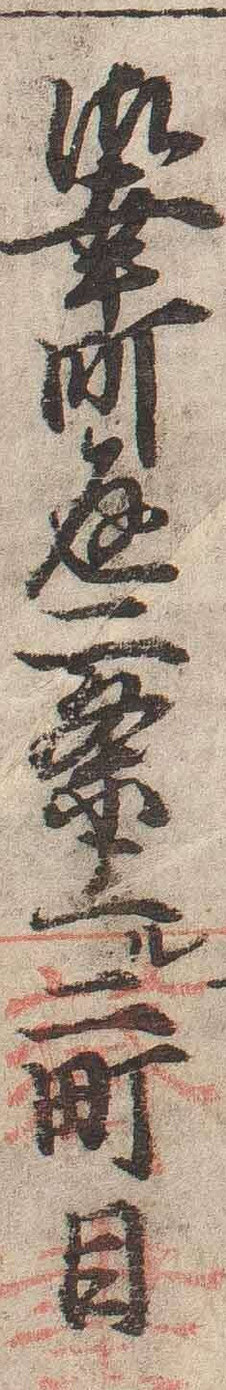御幸町通二条上二町目
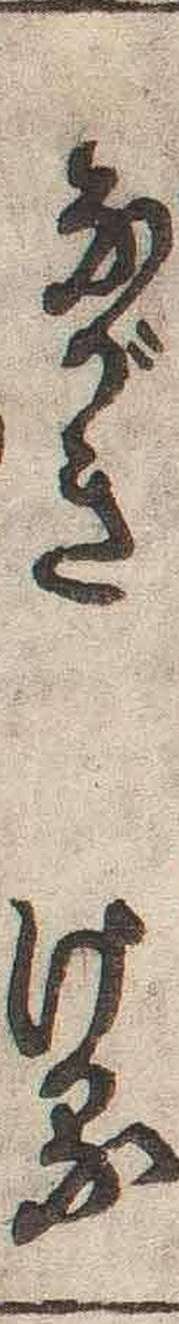ながきける
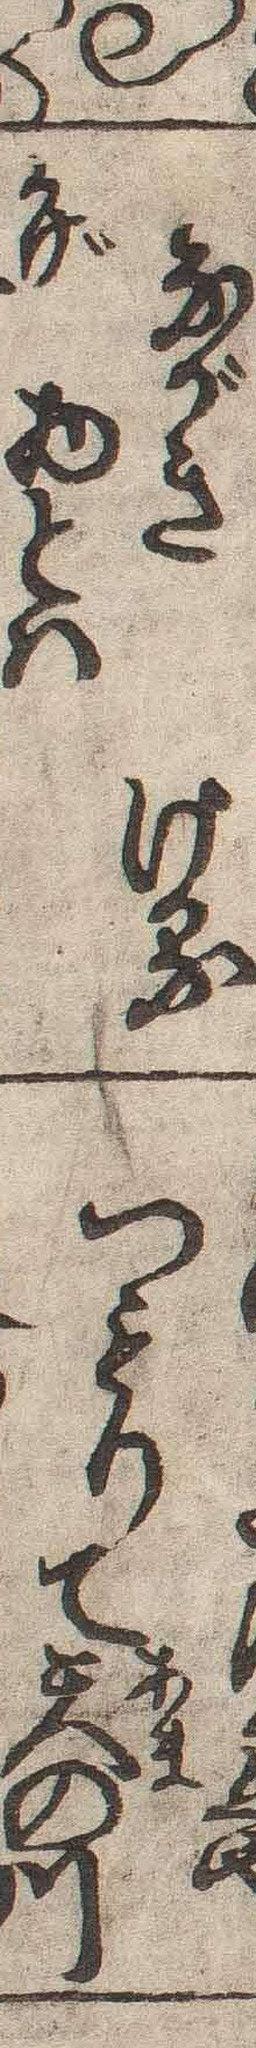つもりて天の川
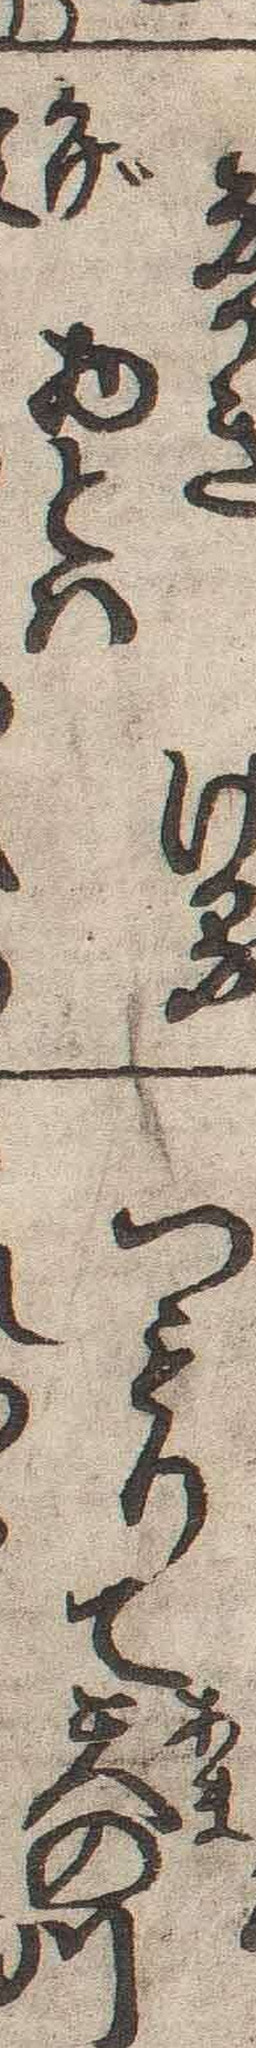物とは
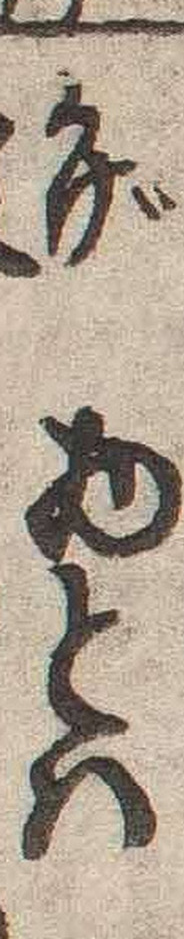物とは
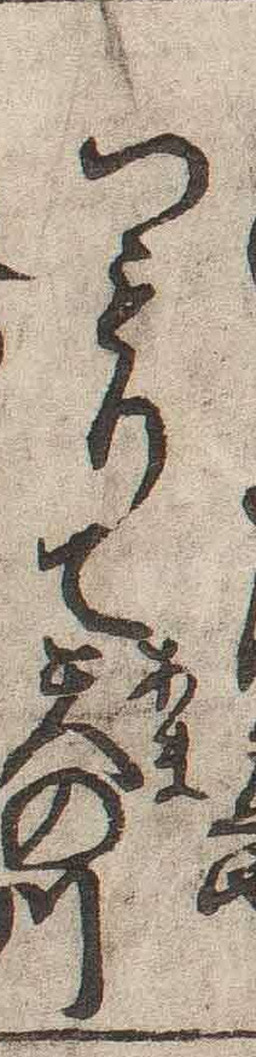つもりて天の川
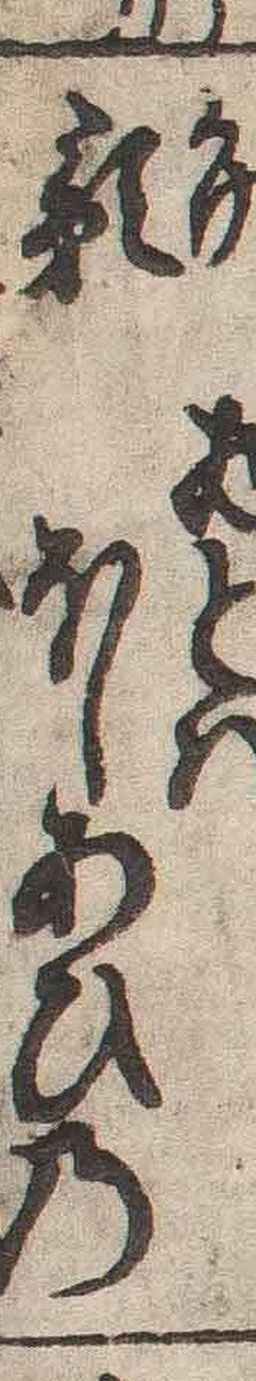影ほしあひの
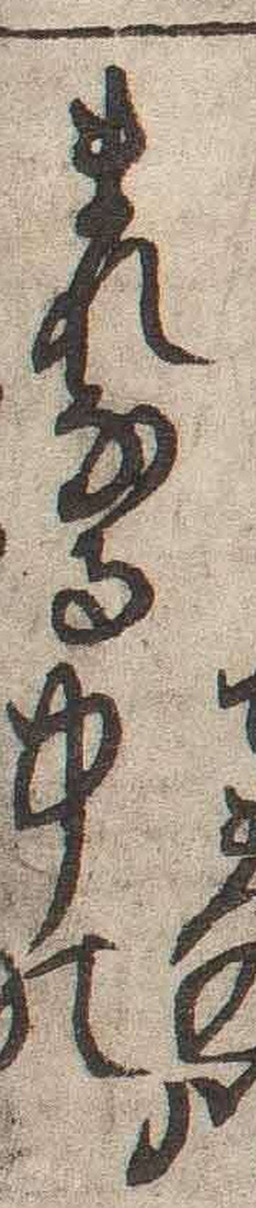まれなる中の
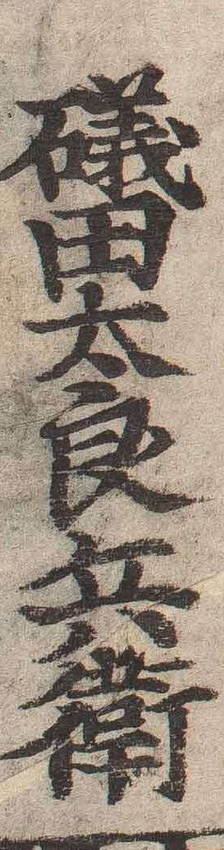磯田太良兵衛波
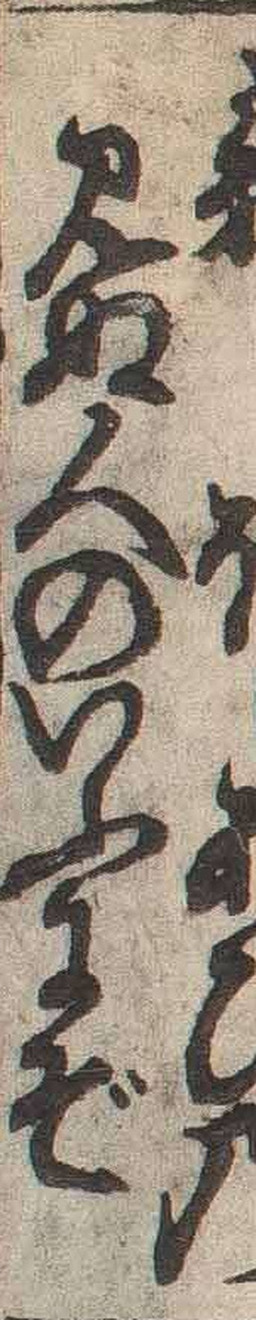見ぬ人のいふにぞ
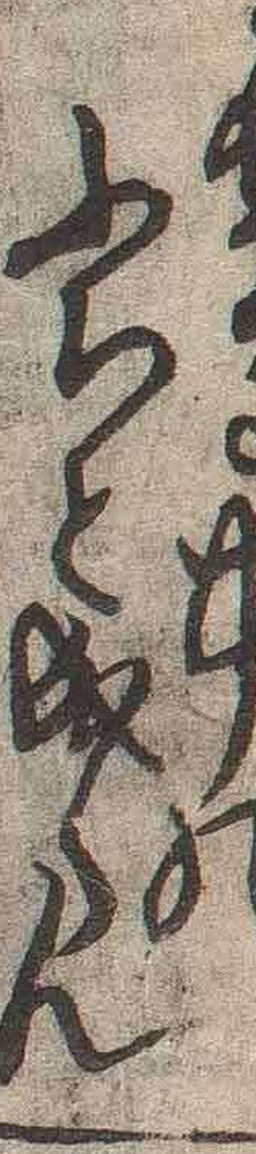ふちと成らん
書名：伊勢物語
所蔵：東京学芸大学附属図書館 国文学研究資料館
